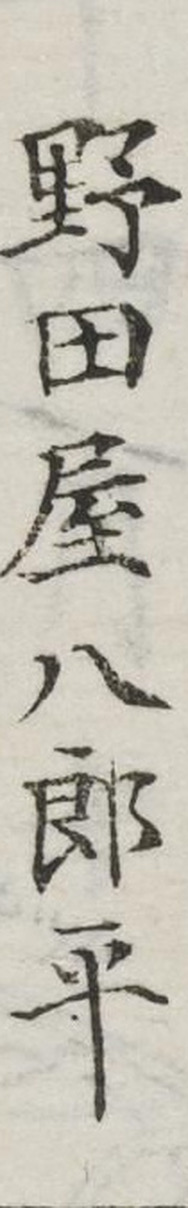野田屋八郎平
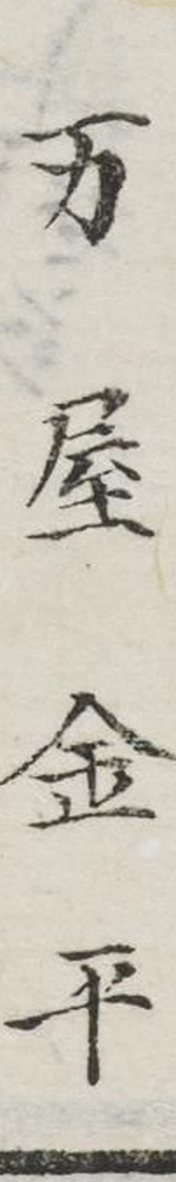万屋金平
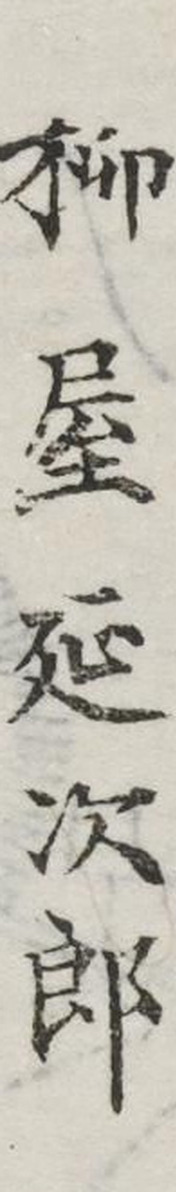柳屋延次郎
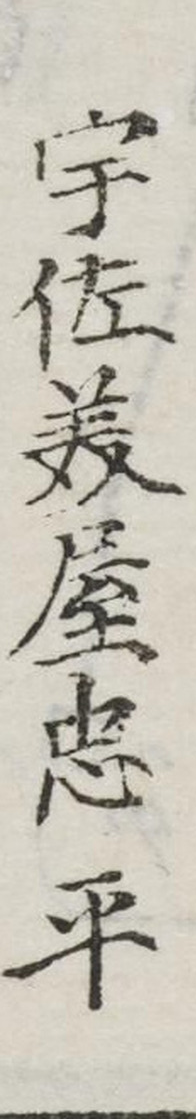宇佐美屋忠平
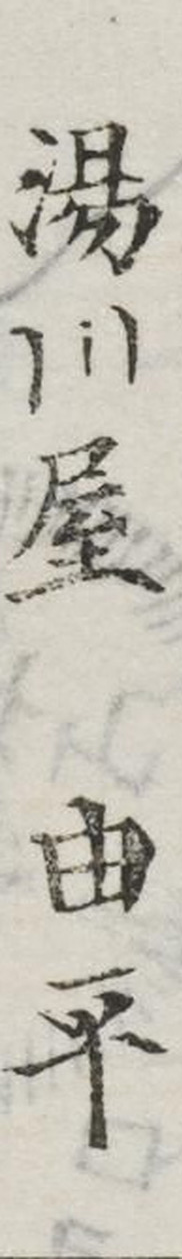湯川屋由平
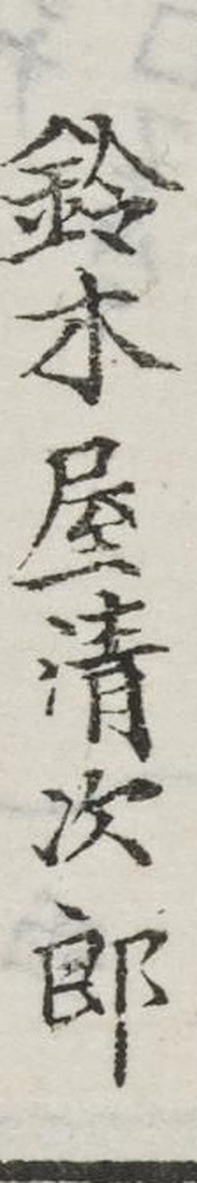鈴木屋清次郎
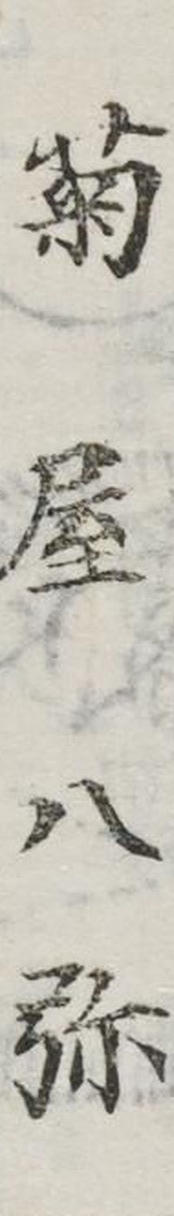菊屋八弥
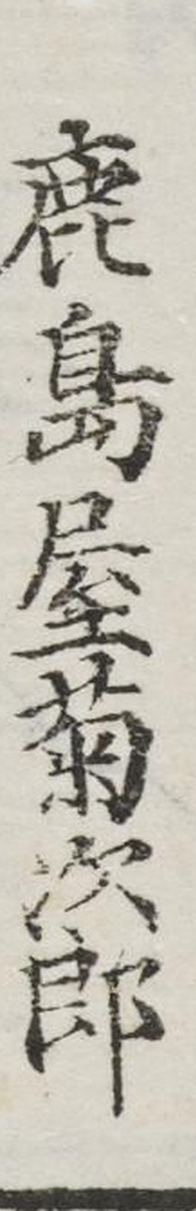鹿島屋菊次郎
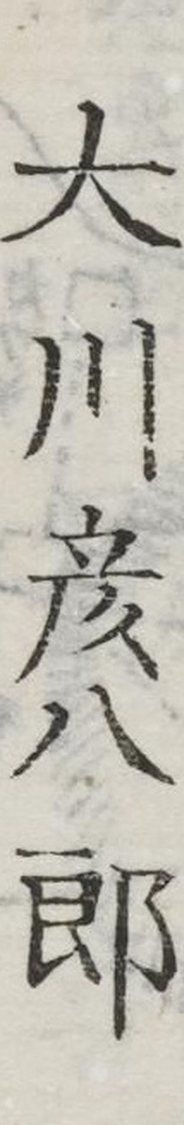大川彦八郎
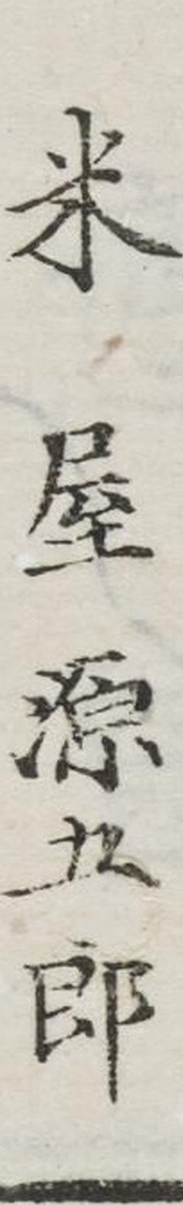米屋源五郎
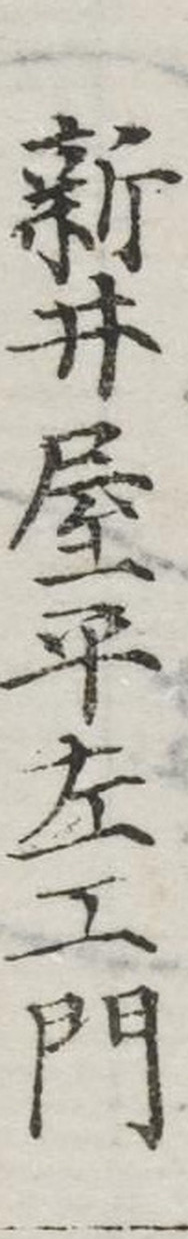新井屋平左ェ門
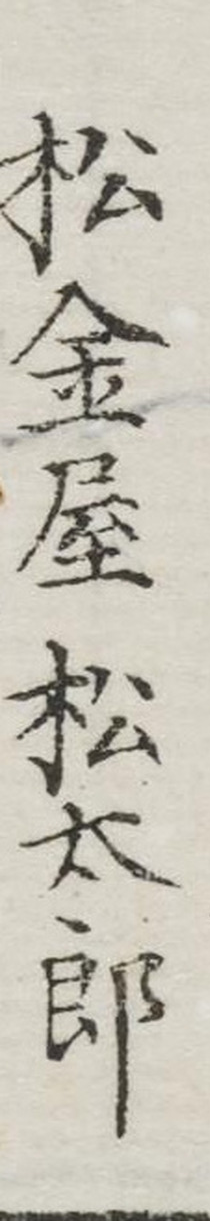松金屋松太郎
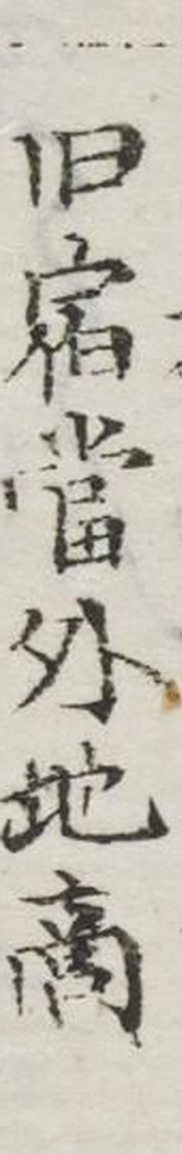旧宿當外地商
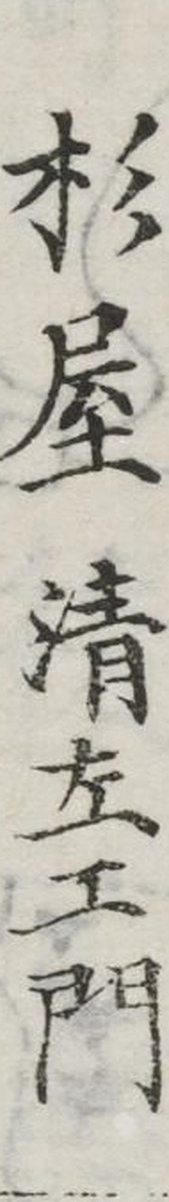杉屋清左ェ門
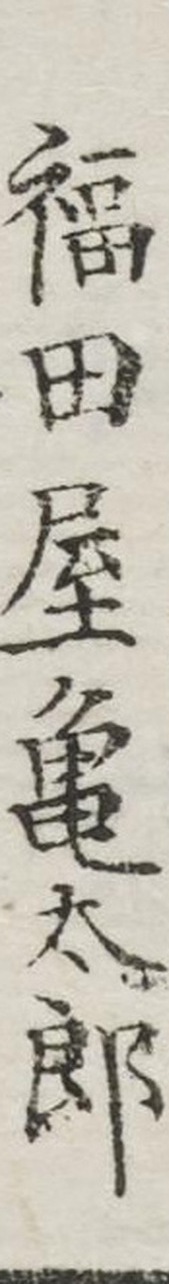福田屋亀太郎
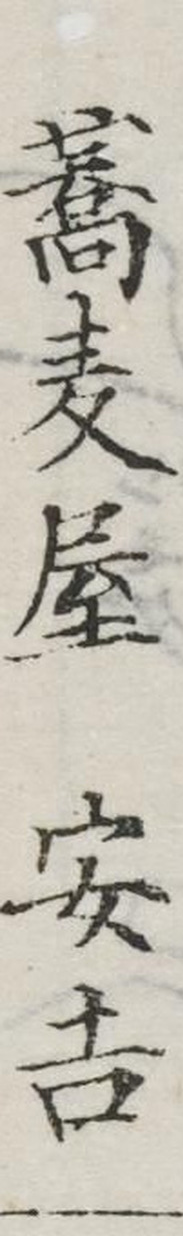蕎麦屋安吉
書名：伊豆国修善寺温泉名所記　全
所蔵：東京大学地震研究所図書室 Earthquake Research Institute Library, The University of Tokyo, JAPAN
